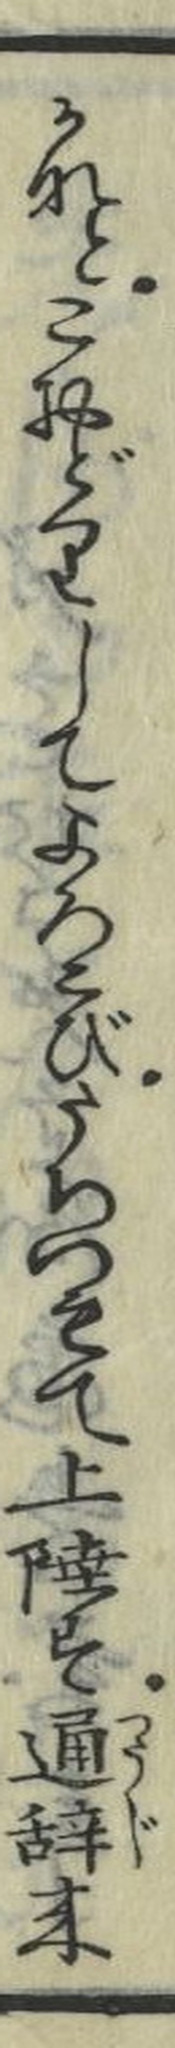かなと・こおどりしてよろこび・うちつれて上陸す・通辞来
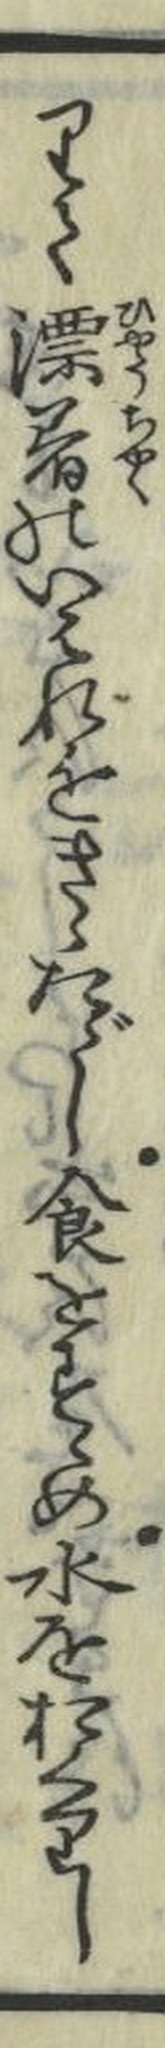りて漂着のいはれをきゝたゞし・食をすゝめ・水をおくりし
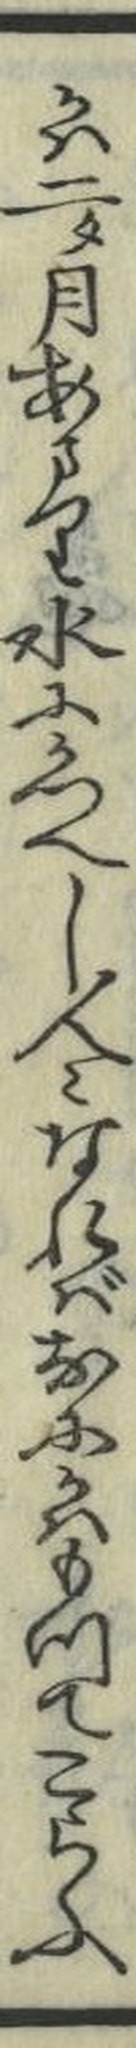かは・二タ月あまり水にかつへし人々なれば・なにかはもつてこらふ
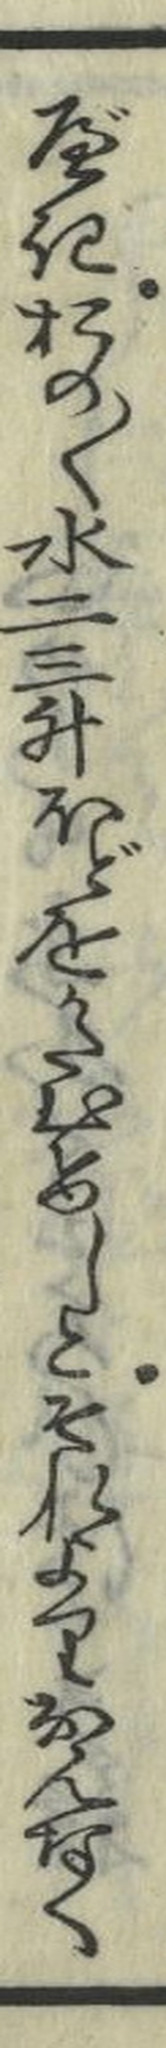べき・おの〳〵水二三升ほどをかたむけしと・それよりなんなく
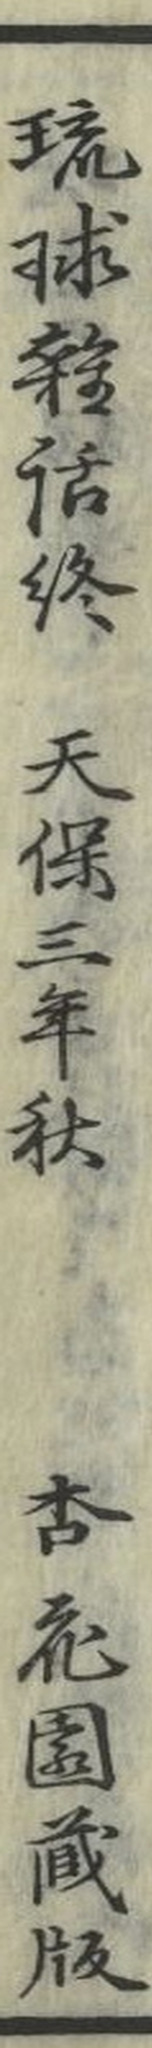琉林雜話終天保三年秋杏花園蔵版

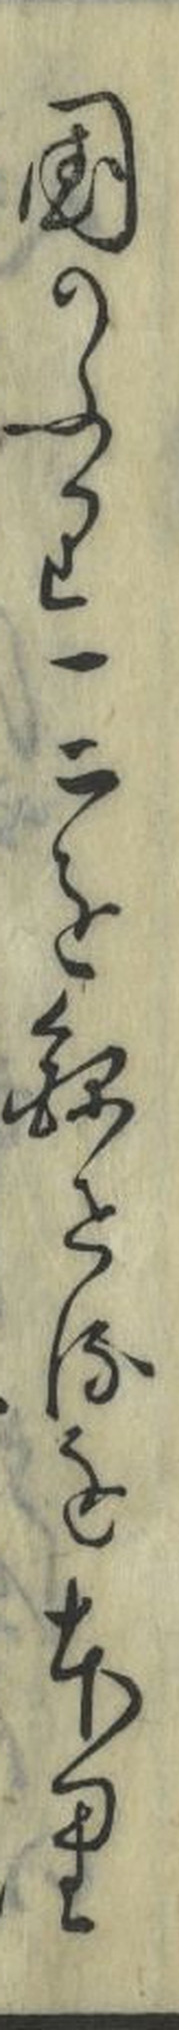国のふり一二を録せるをほり
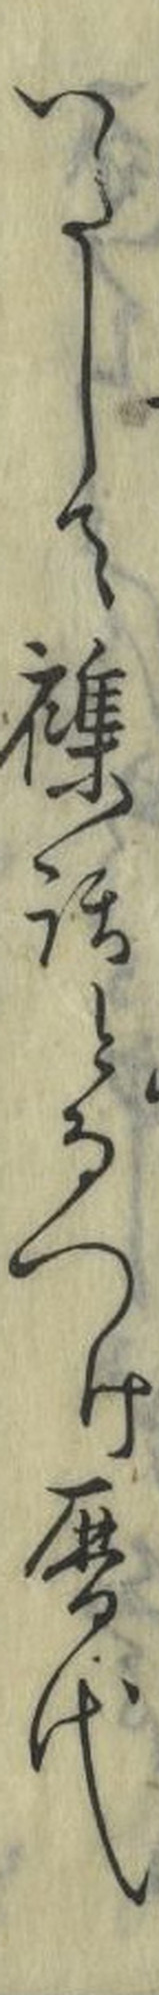いたして襍話となつけ暦代
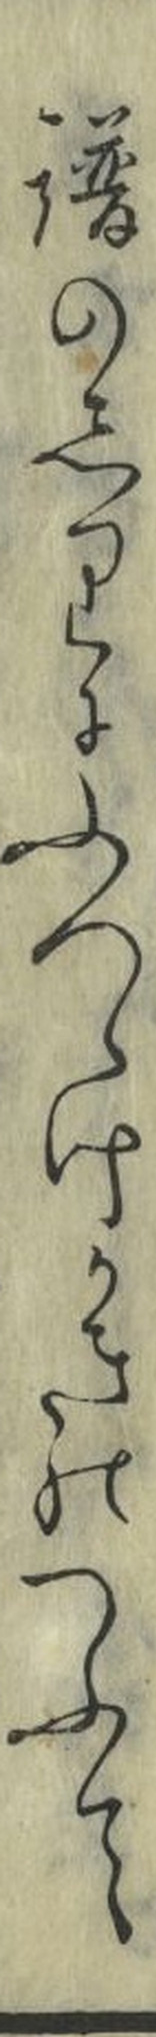譜のしりにふつゝけかきのつふて
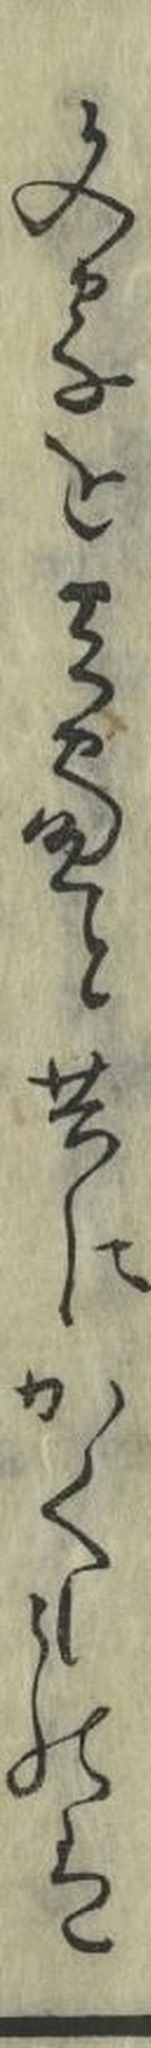文字をは蜀と共にかくものは
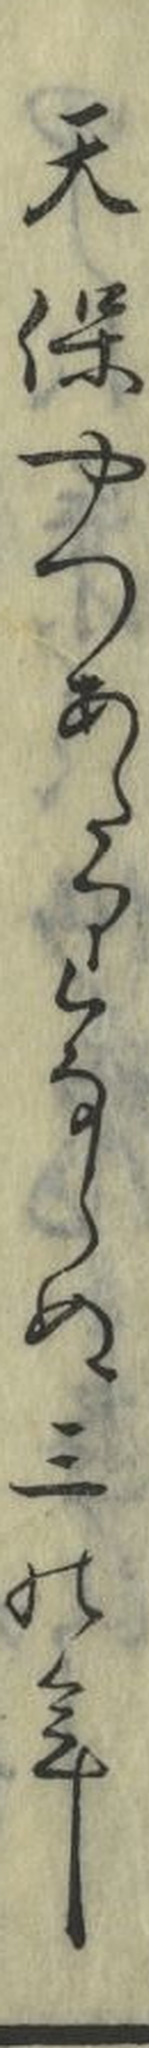天保やつあたりならぬ三の年
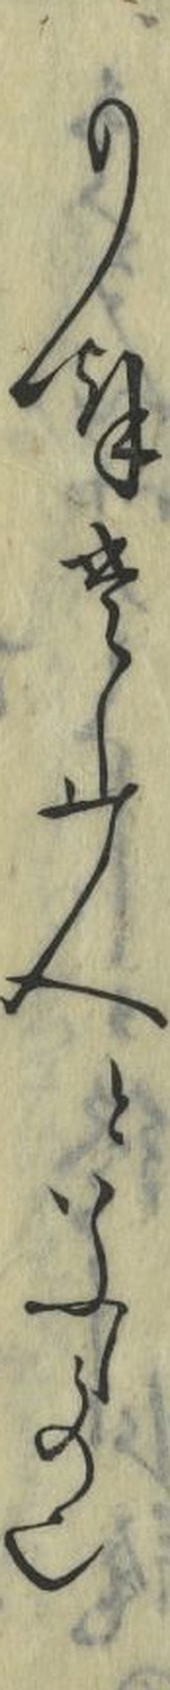のほそみ人といふもの也
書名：琉球秊代記 附雑話 全
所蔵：University of the Ryukyus Library
